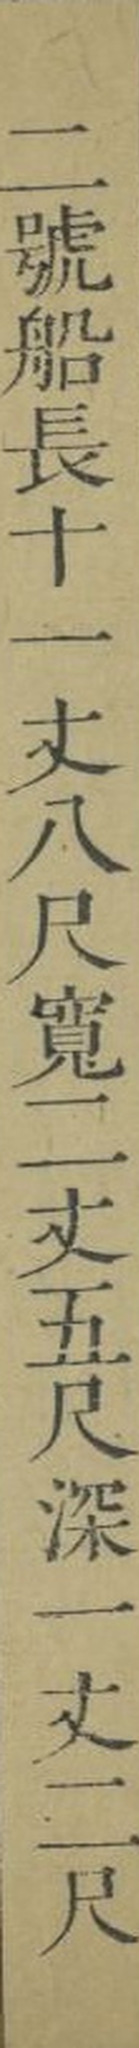二號船長十一丈八尺寬二丈五尺深一丈二尺
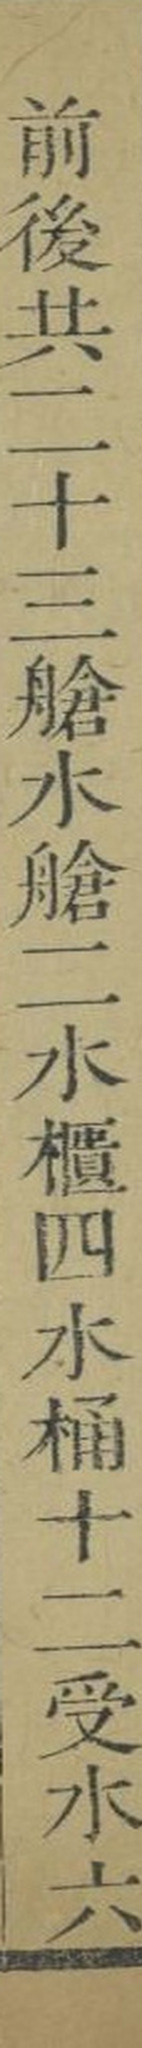前後共二十三艙水艙二水櫃四水桶十二受水六
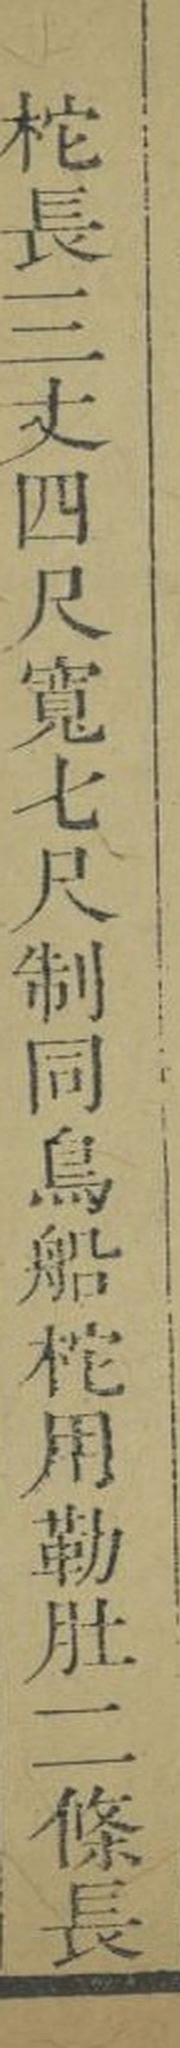柁長三丈四尺寬七尺制同鳥船柁用勒肚二條長
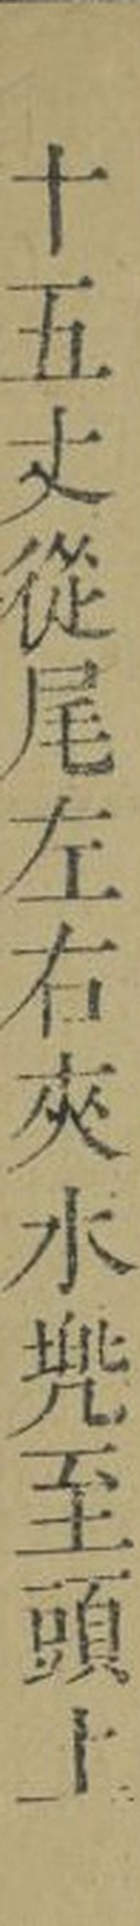十五丈從尾左右夾水兠至頭上
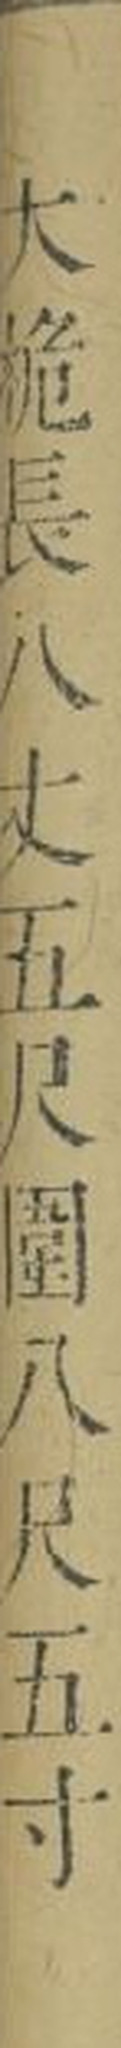大桅長八丈五尺圍八尺五寸
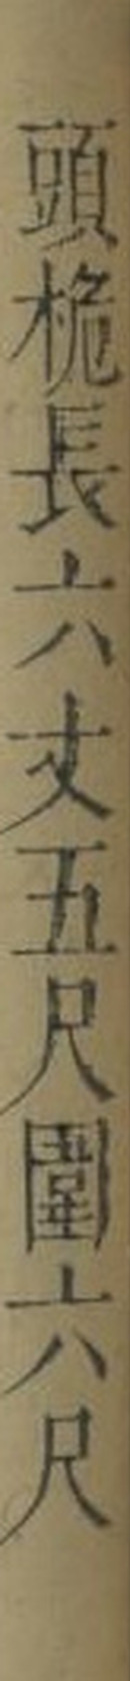頭桅長六丈五尺圍六尺
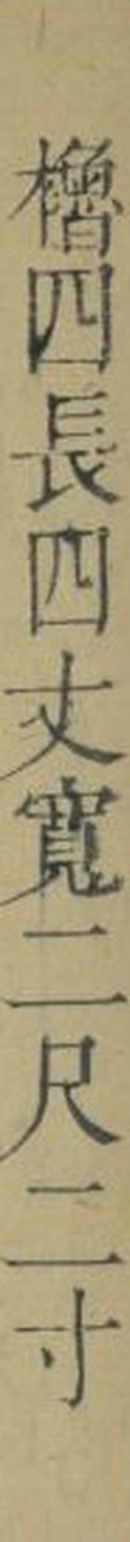櫓四長四丈寬二尺二寸
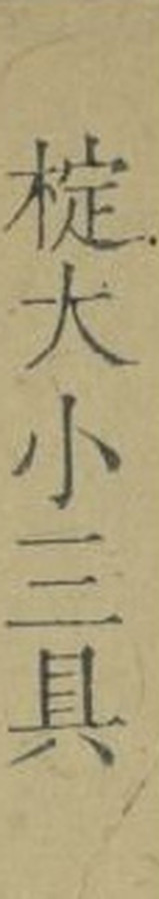椗大小三具
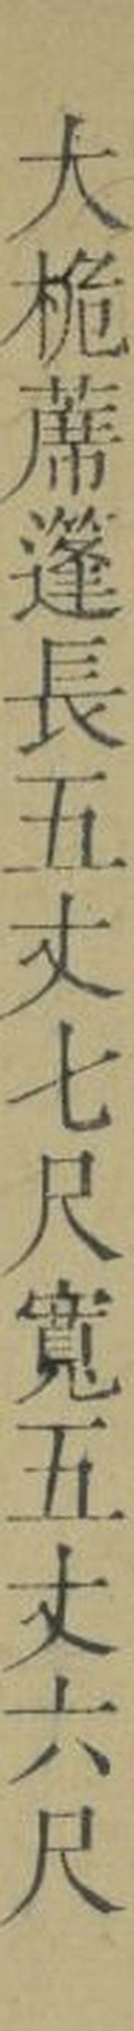大桅蓆篷長五丈七尺寬五丈六尺
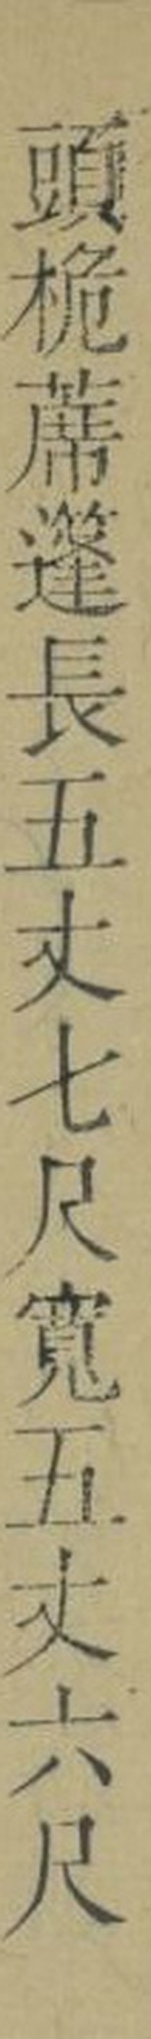頭桅蓆篷長五丈七尺寬五丈六尺
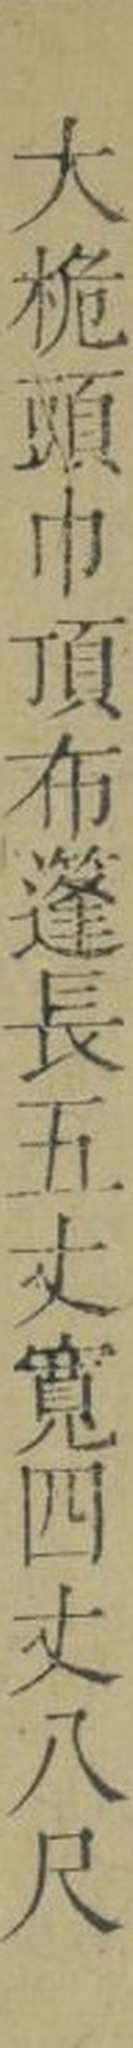大桅頭巾頂布篷長五丈寬四丈八尺
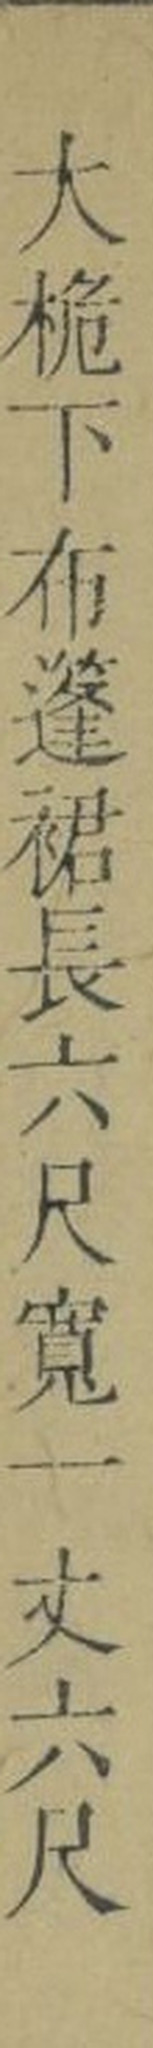大桅下布篷裙長六尺寬一丈六尺
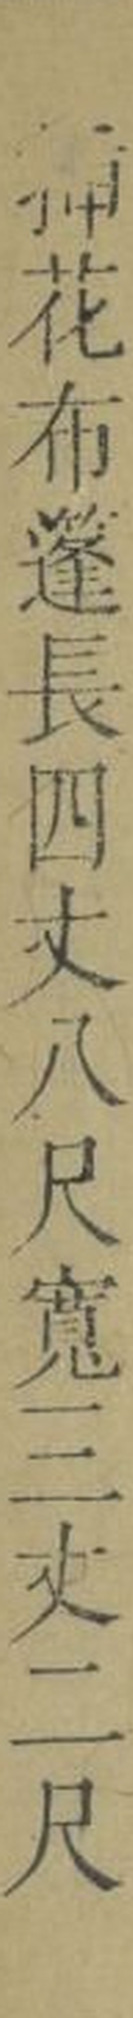揷花布篷長四丈八尺寬三丈二尺
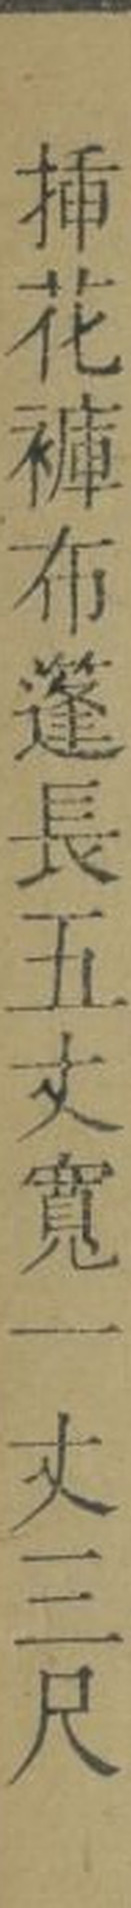揷花褲布篷長五丈寬一丈三尺

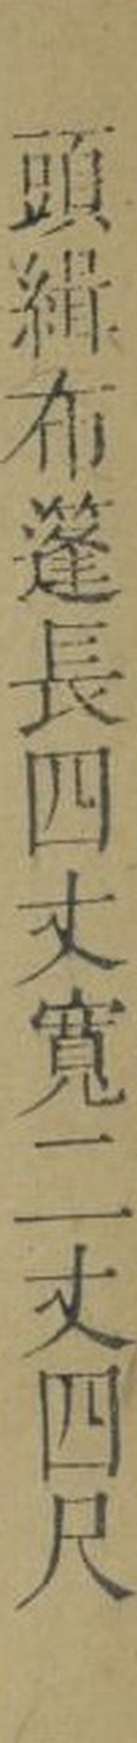頭緝布篷長四丈寬二丈四尺
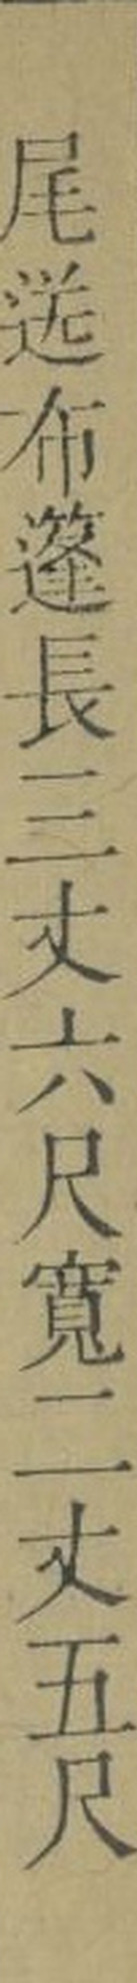尾送布篷長三丈六尺寬二丈五尺
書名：中山伝信録 巻一
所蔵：University of the Ryukyus Library
